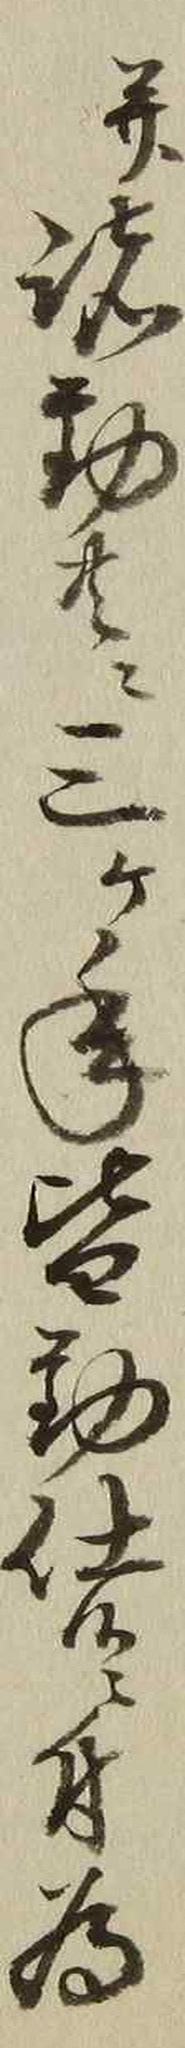并諸勤共ニ三ケ年皆勤仕候ニ付為
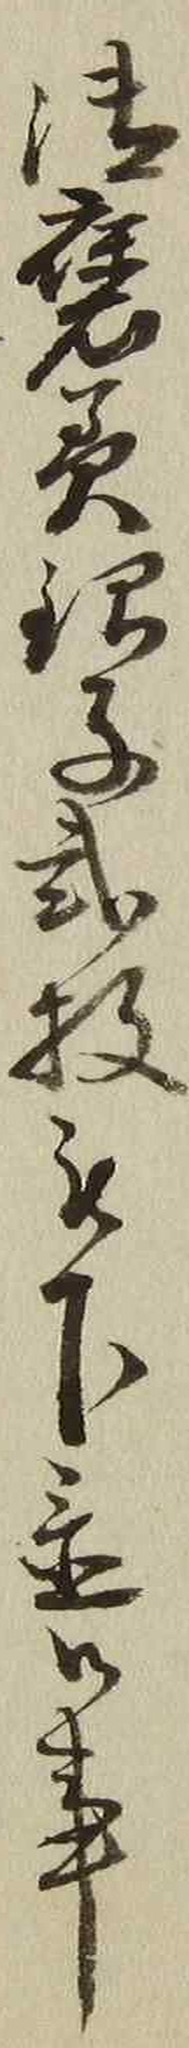御褒美銀子弐枚被下置候事
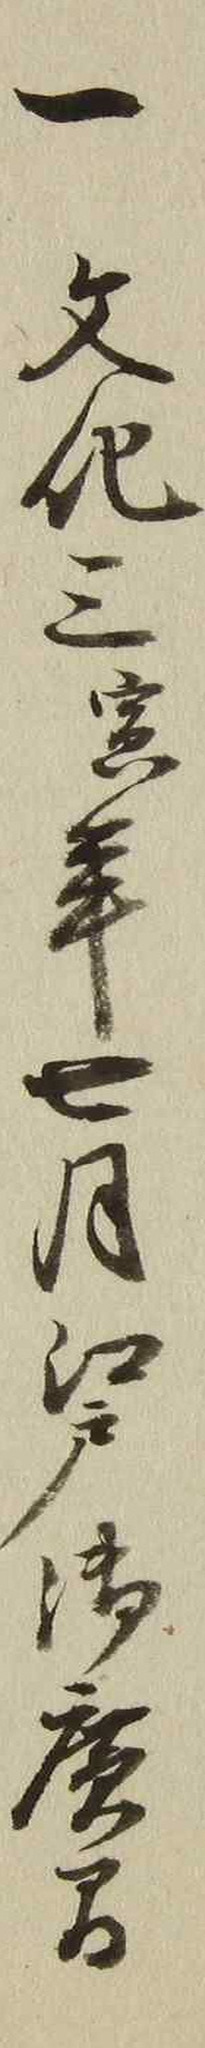一文化三寅年七月江戸御広間
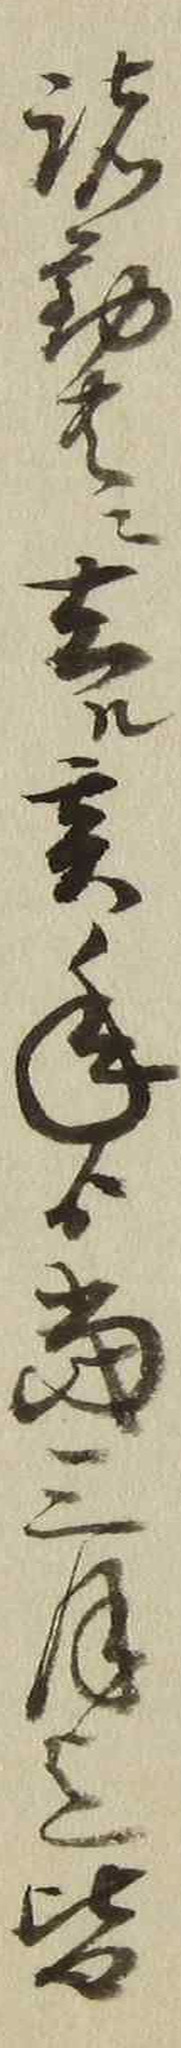諸勤共ニ去ル亥年ゟ当三月迄皆
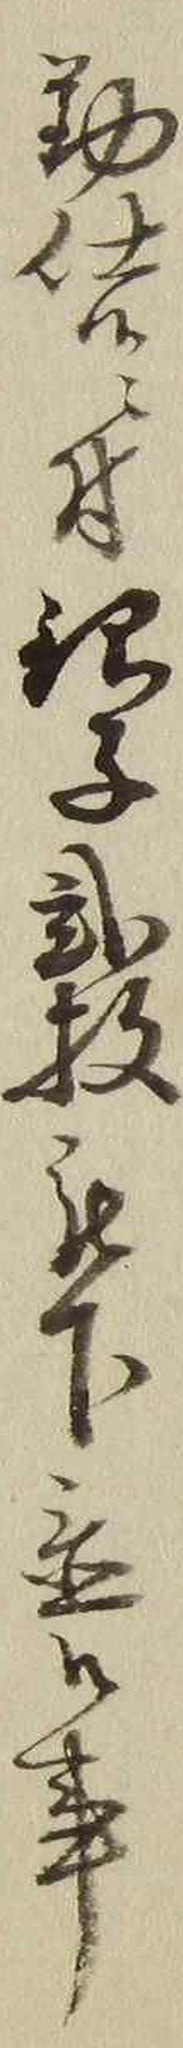勤仕候ニ付銀子弐枚被下置候事
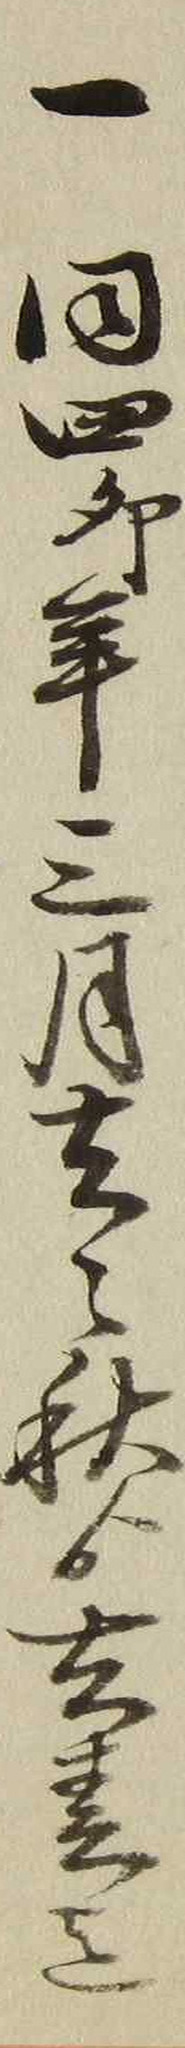一同四卯年三月去々秋ゟ去春迄
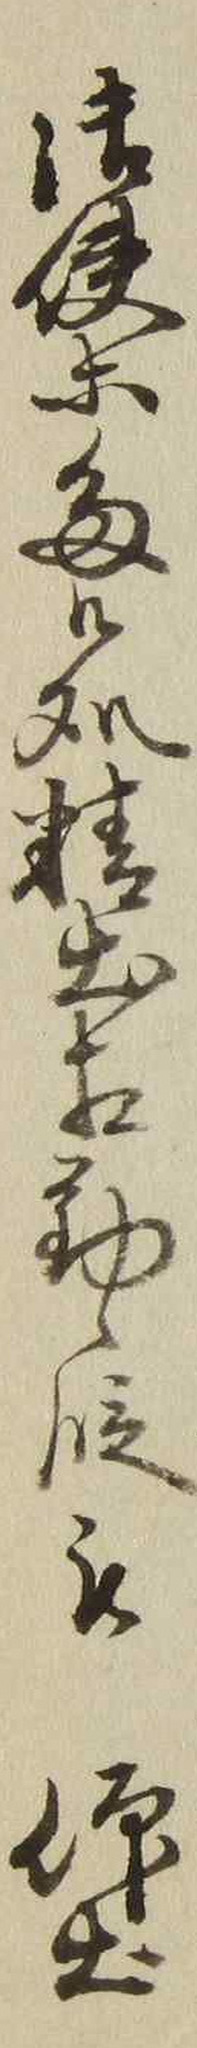御使等多候処精出相勤候段被仰出
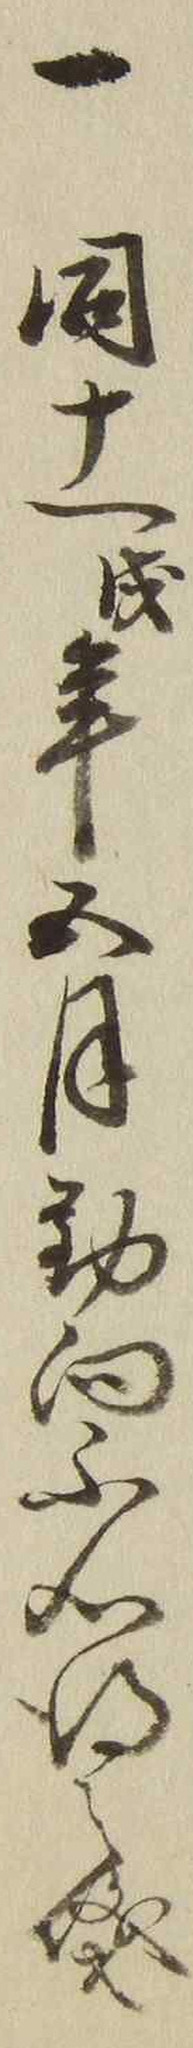一同十一戌年五月勤向不心得の儀共

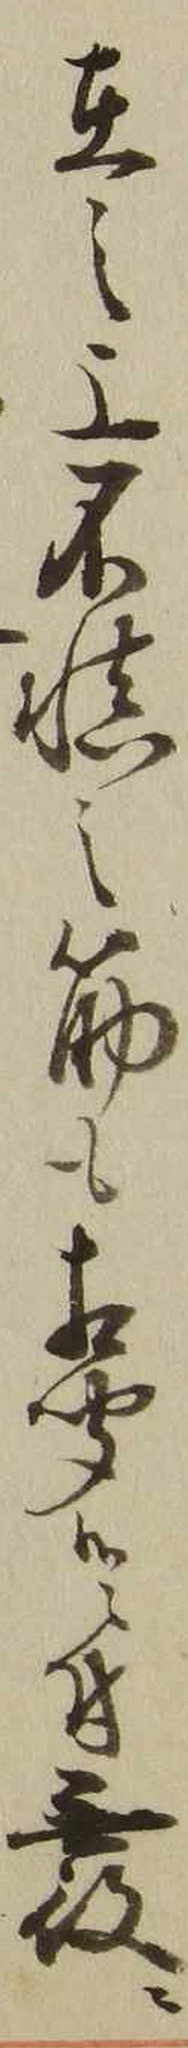在之上不慎之筋も相聞候ニ付無役ニ
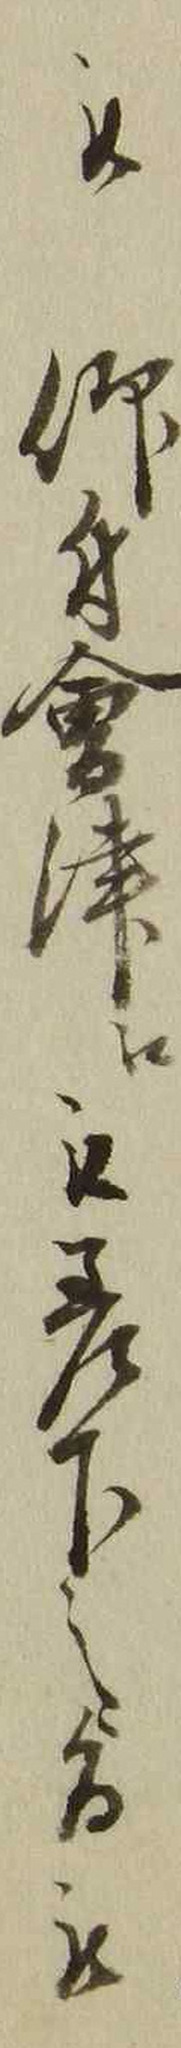被仰付会津江被差下之旨被
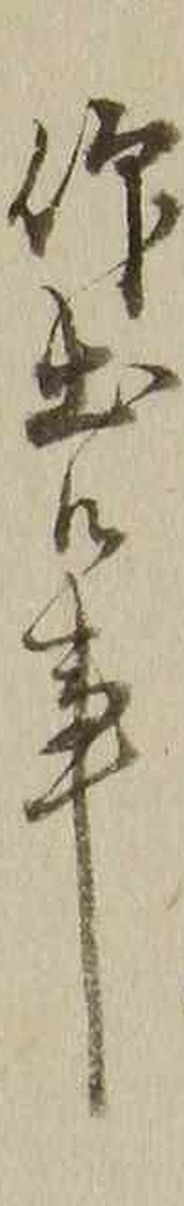仰出候事
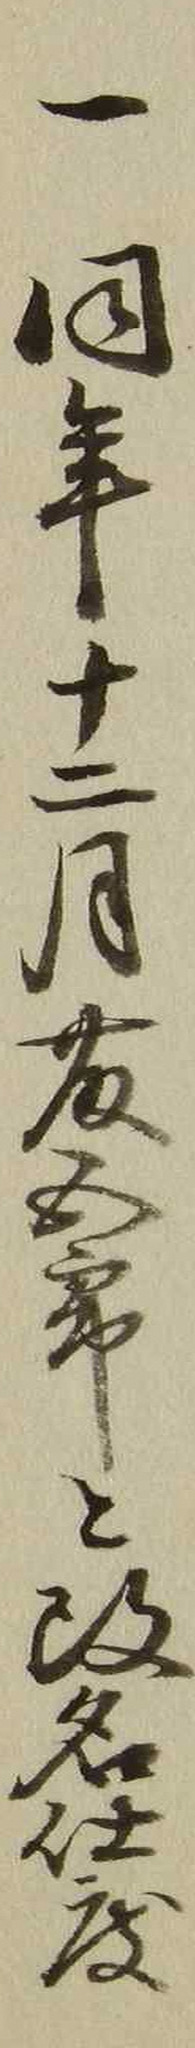一同年十二月藤五郎と改名仕度
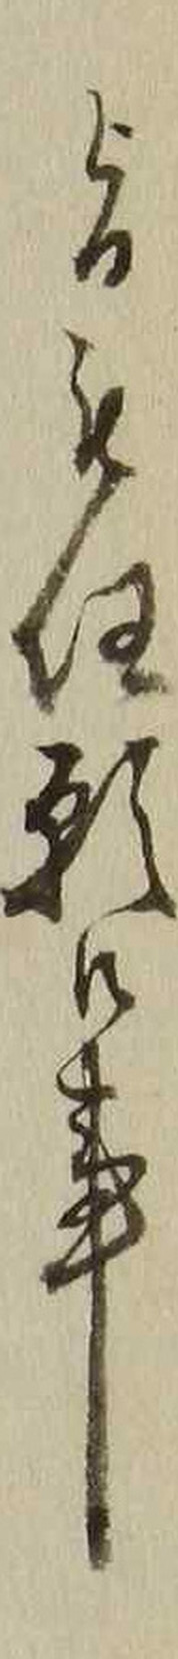旨被任願候事
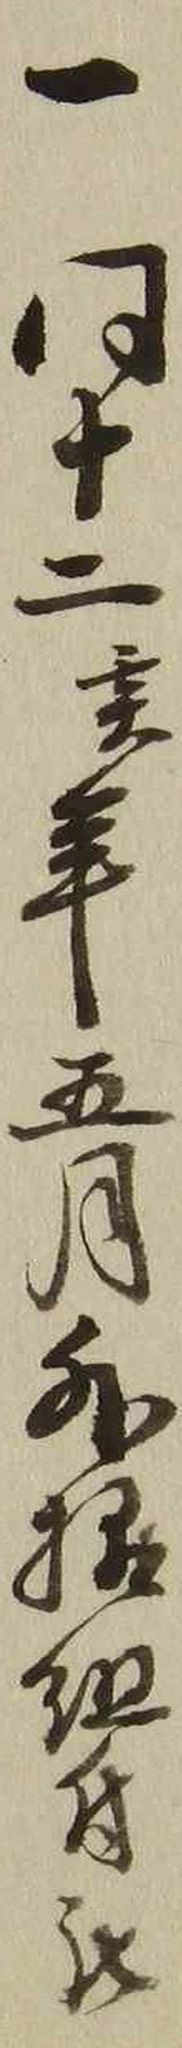一同十二亥年五月外様組付被
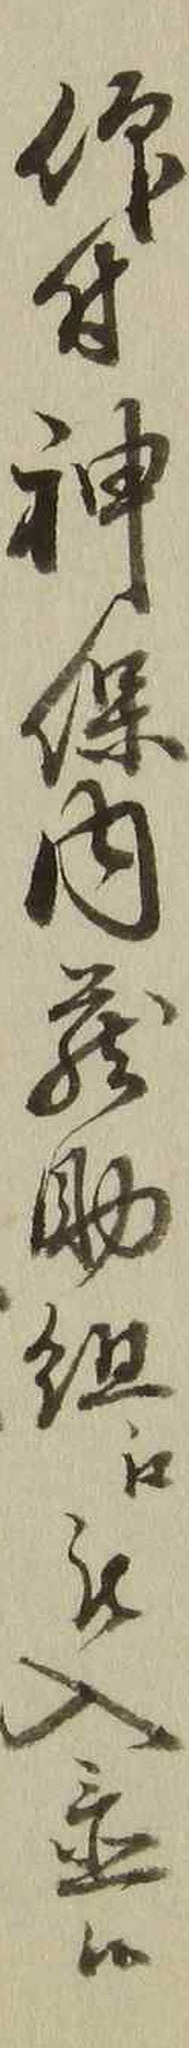仰付神保内蔵助組江被入置候
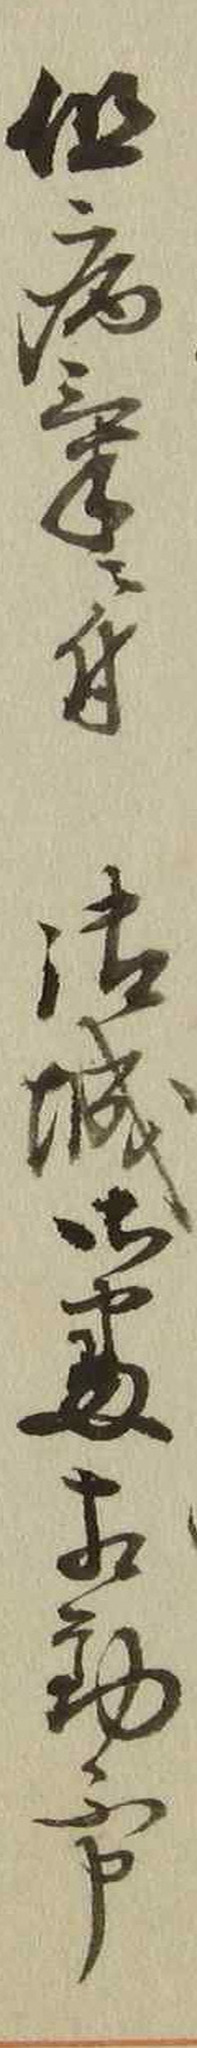但病気ニ付御城御番相勤不申
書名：諸士系譜　巻之31　い之部31
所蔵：会津若松市立会津図書館
